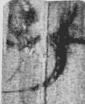孤
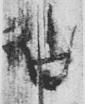居
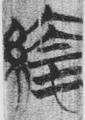絝
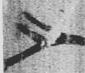之
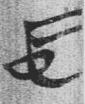𠁩
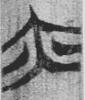亦
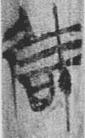唯
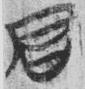君
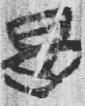是
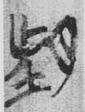望
